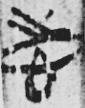志
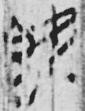既
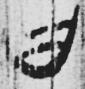曰
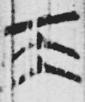天
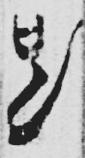也
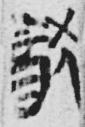猶
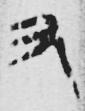又（有）
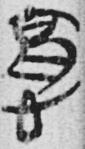惋（怨）
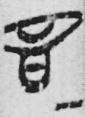言
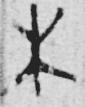木
